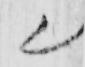乙
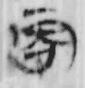丙
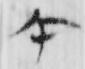午
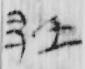邸
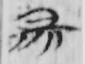昜（陽）
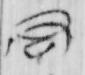君
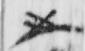之
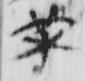某
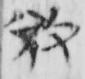敓
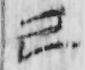己
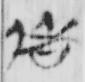俈
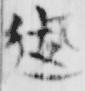○（卜）
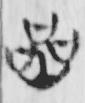嵒
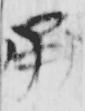甬
